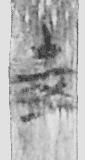{十五}
